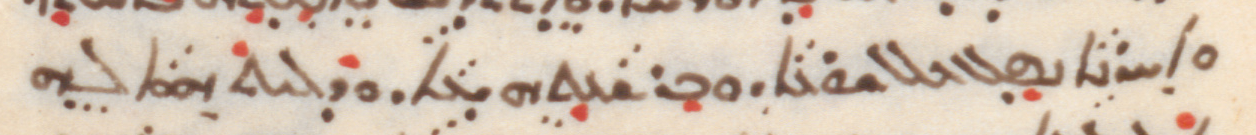ܘܐܚܪܢܐ ܢܦ̣ܠ ܟܠ ܫܘ̇ܥܐ. ܘܒܪ ܫܥܬܗ ܝ̣ܥܐ. ܘܕܠܝܬ ܗܘܐ ܠܗ
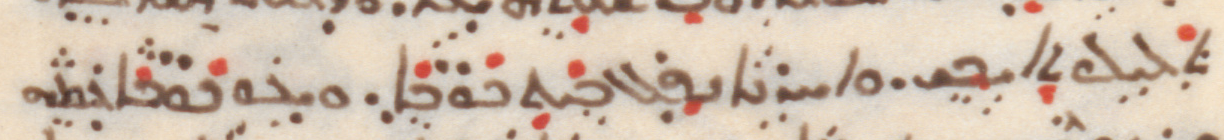ܬܠܝܠܘܬܐ ܝܒܫ. ܘܐܚܪܢܐ ܢܦ̣ܠ ܒܝܬ ܟܘ̈ܒܐ܆ ܘܝܥ̣ܘ ܟܘ̈ܒܐ ܥܡܗ
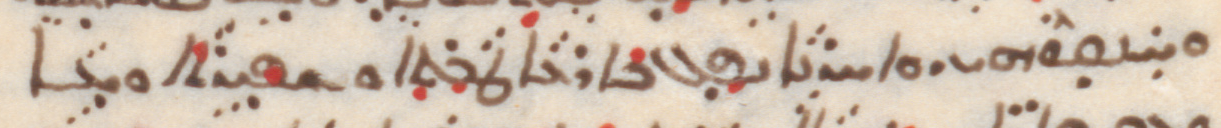ܘܚܢܩ̣ܘܗܝ. ܘܐܚܪܢܐ ܢܦ̣ܠ ܒܐܪܥܐ ܛܒ̇ܬܐ ܘܫܦܝ̣ܪܬܐ ܘܝ̣ܥܐ
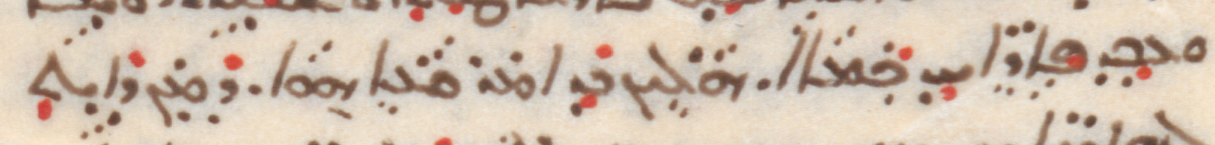ܘܥܒ̣ܕ ܦܐܪ̈ܐ ܚܕ ܒܡܐܐ. ܗ̇ܠܝܢ ܟܕ ܐܡ̇ܪ ܩ̇ܥܐ ܗܘܐ. ܕܡ̇ܢ ܕܐܝ̣ܬ
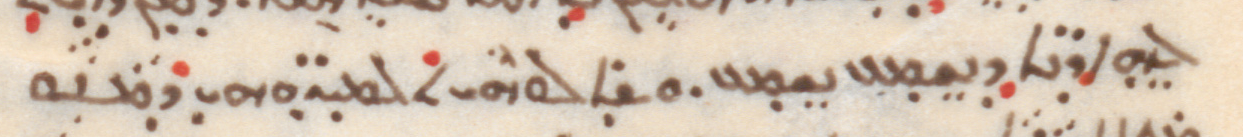ܠܗ ܐܕ̈ܢܐ ܕܢܫܡ̣ܥ ܢܫܡ̣ܥ. ܘܫ̣̇ܐܠܘܗܝ ܬܠܡܝܕܘ̈ܗܝ ܕܡ̇ܢܘ
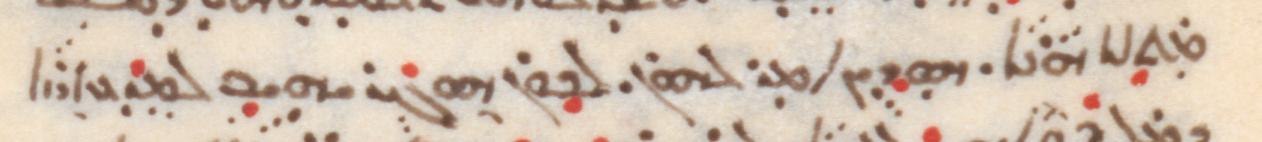ܡܬܠܐ ܗ̇ܢܐ. ܗ̣ܘ ܕܝܢ ܐܡ̣ܪ ܠܗܘܢ. ܠܟܘܢ ܗܘܓܝܪ ܝܗ̣ܝܒ ܠܡܕܥ ܐܪܙܐ
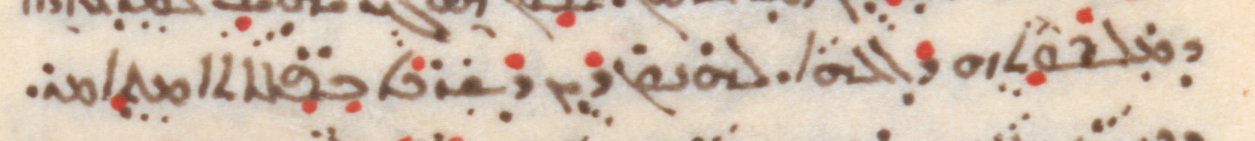ܕܡܠܟܘܬܗ ܕܐܠܗܐ. ܠܗ̇ܢܘܢ ܕܝܢ ܕܫܪܟܐ ܒܦ̈ܠܐܬܐ ܡܬ̣ܐܡܪ.
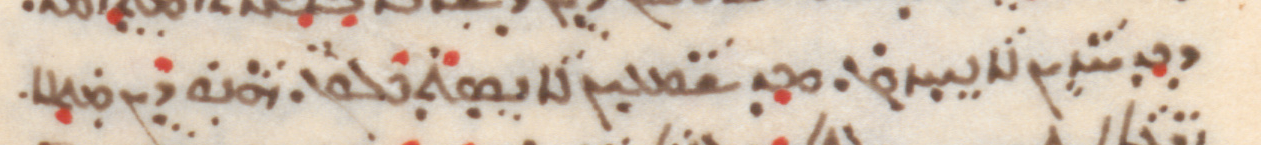ܕܟܕ ܚ̇ܙܝܢ ܠܐ ܢܚ̣ܙܘܢ. ܘܟܕ ܫ̇ܡܥܝܢ ܠܐ ܢܣ̣ܬܟܠܘܢ. ܗ̇ܢܘ ܕܝܢ ܡܬܠܐ.
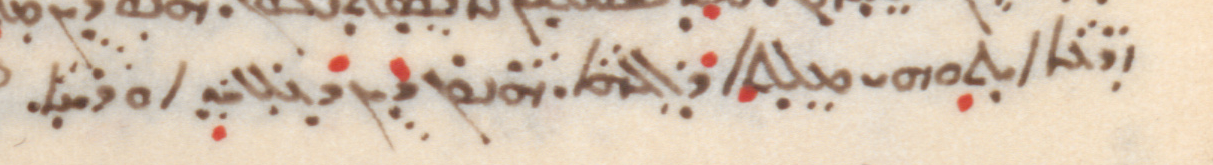ܙܪܥܐ ܐܝܬܘܗܝ ܡܠܬܐ ܕܐܠܗܐ. ܗ̇ܢܘܢ ܕܝܢ ܕܥܠ ܝܕ ܐܘܪܚܐ܆
